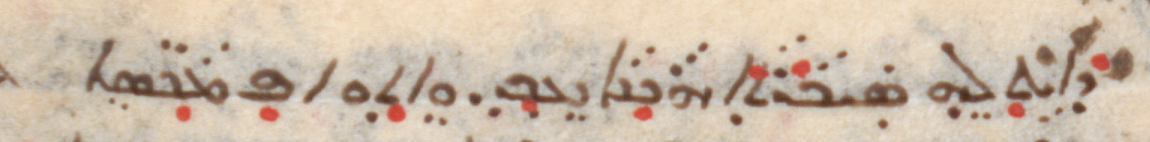ܕܐܝܬ ܠܗ ܣܝܒܪܬܐ ܗܟܢܐ ܢܥܒܕ. ܘܐܬ̣ܘ ܐܦ ܡܟ̈ܣܐ
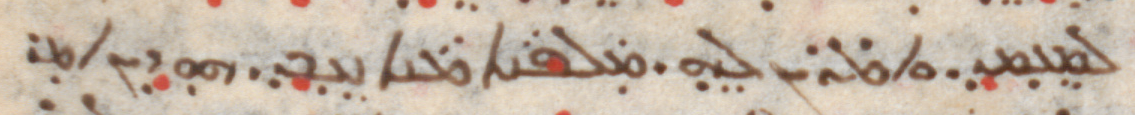ܠܡܥܡܕ. ܘܐܡܪܝܢ ܠܗ. ܡܠܦܢܐ ܡܢܐ ܢܥܒܕ܆ ܗ̣ܘ ܕܝܢ ܐܡ̣ܪ
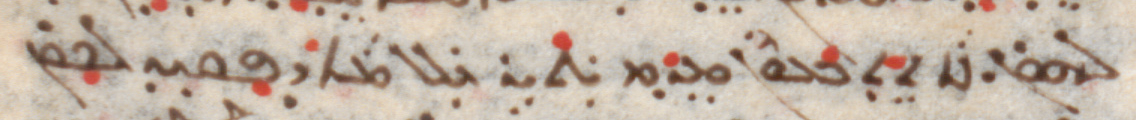ܠܗܘܢ. ܠܐ ܬܬܒܥܘܢ ܡܕܡ ܝܬܝܪ ܥܠ ܡܐ ܕܦܩܝܕ ܠܟܘܢ
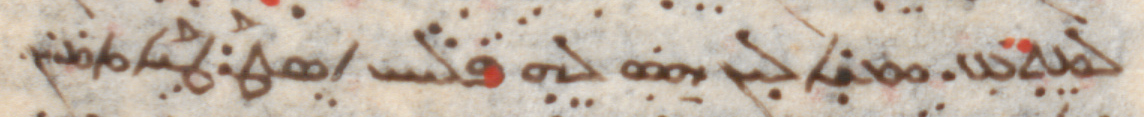ܠܡܬܒܥ. ܘܡܫܐܠܝܢ ܗܘܘ ܠܗ ܦܠ̈ܚܝ ܐܣܛܪܛܝܐ ܘܐܡܪܝܢ
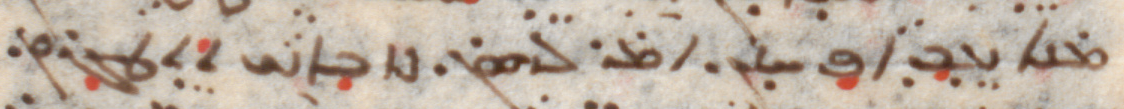ܡ̇ܢܐ ܢܥܒܕ ܐܦ ܚܢܢ. ܐܡ̇ܪ ܠܗܘܢ. ܠܐ ܒܐܢܫ ܬܬܛܓܪܘܢ.
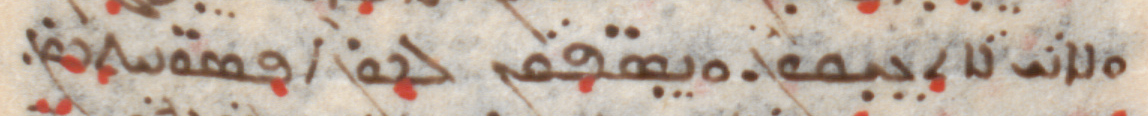ܘܠܐܢܫ ܠܐ ܬܥܫܩܘܢ. ܘܢܣ̈ܦܩܢ ܠܟܘܢ ܐܦܣܘ̈ܢܝܬܟܘܢ.
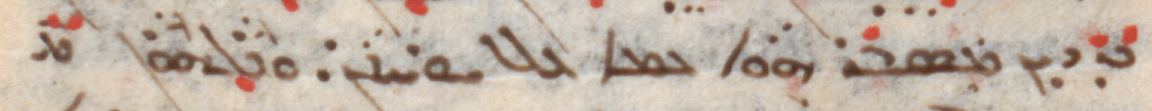ܟܕ ܕܝܢ ܡܣܒܪ ܗܘܐ ܥܡܐ ܥܠ ܝܘܚܢܢ: ܘܟܠܗܘܢ ܏ܡ
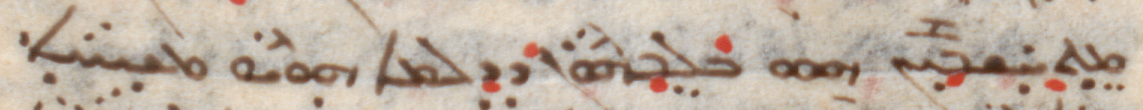ܡܬܚܫܒܝܢ ܗܘܘ ܒܠܒܗܘܢ ܕܕܠܡܐ ܗܘܝܘ ܡܫܝܚܐ܆
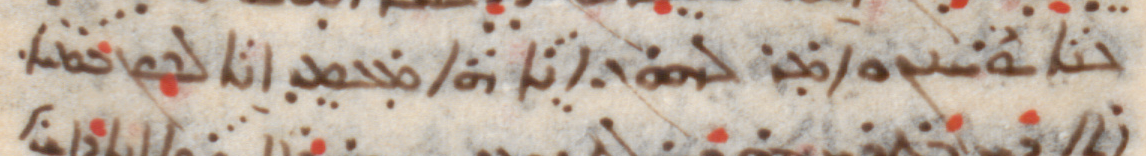ܥܢܐ ܝܘܚܢܢ ܘܐܡ̣ܪ ܠܗܘܢ. ܐܢܐ ܗܐ ܡܥܡܕ ܐܢܐ ܠܟܘܢ ܒܡ̈ܝܐ.
